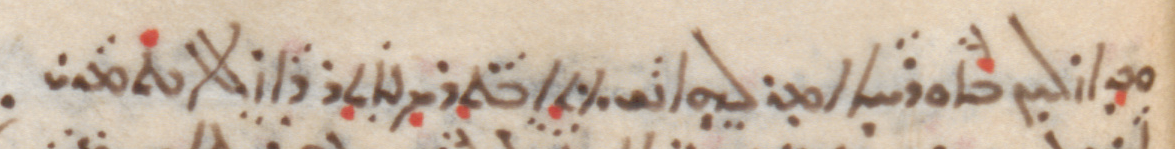ܘܟܕ ܐܙ̇ܠܝܢ ܒܐܘܪܚܐ ܐܡ̣ܪ ܠܗ ܐܢܫ. ܐܬ̇ܐ ܒܬܪܟ ܠܐܬܪ ܕܐܙ̇ܠ ܐܢܬ ܡܪܝ
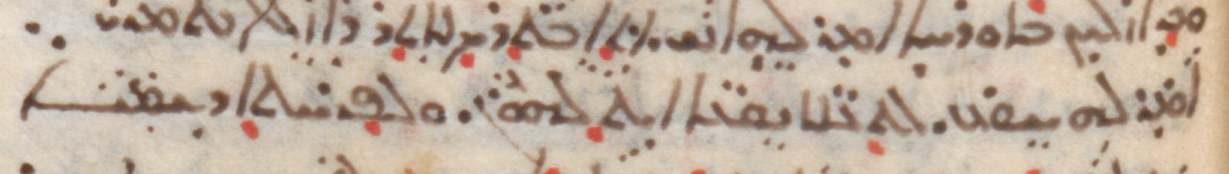ܐܡ̣ܪ ܠܗ ܝܫܘܥ. ܠܬܥ̈ܠܐ ܢܩ̈ܥܐ ܐܝܬ ܠܗܘܢ. ܘܠܦܪܚܬܐ ܕܫܡܝܐ
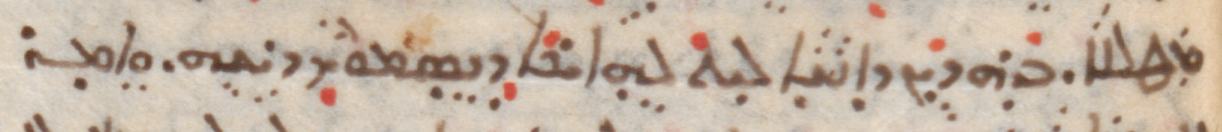ܡܛܠܠܐ. ܒܪܗ ܕܝܢ ܕܐܢܫܐ ܠܝܬ ܠܗ ܐܝܟܐ ܕܢܣܡܘܟ ܪܝܫܗ. ܘܐܡ̣ܪ
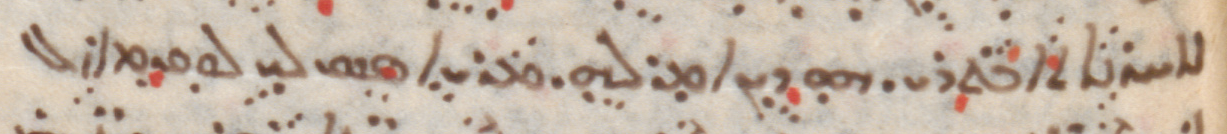ܠܐܚܪܢܐ ܬܐ ܒܬܪܝ. ܗ̣ܘ ܕܝܢ ܐܡ̣ܪ ܠܗ. ܡܪܝ܆ ܐܦܣ ܠܝ ܠܘܩܕܡ ܐܙ̇ܠ
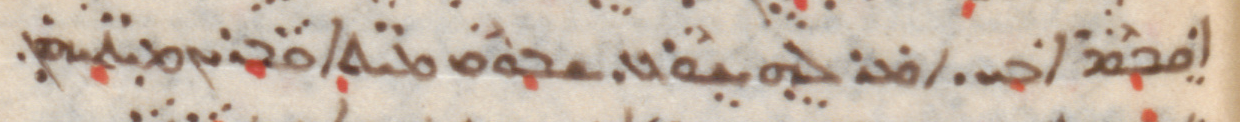ܐܩ̇ܒܘܪ ܐܒܝ. ܐܡܪ ܠܗ ܝܫܘܒ. ܫܒܘܩ ܡܝ̈ܬܐ ܩ̇ܒܪܝܢ ܡܝ̈ܬܝܗܘܢ܆
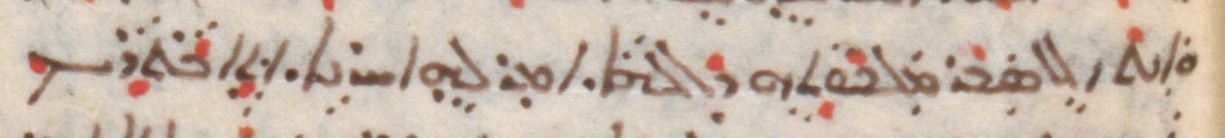ܘܐܢܬ ܙܠ ܣܒܪ ܡܠܟܘܬܗ ܕܐܠܗܐ. ܐܡ̣ܪ ܠܗ ܐܚܪܢܐ. ܐܬ̇ܐ ܒܬܪܝܟ
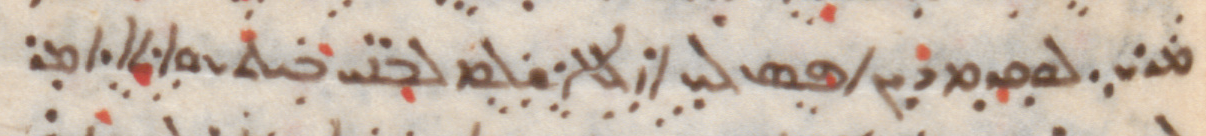ܡܪܝ܆ ܠܘܩܕܡ ܕܝܢ ܐܦܣ ܠܝ ܐܙ̇ܠ ܐܫܠܡ ܠܒ̈ܢܝ ܒܝܬܝ ܘܐܬ̇ܐ. ܐܡ̣ܪ
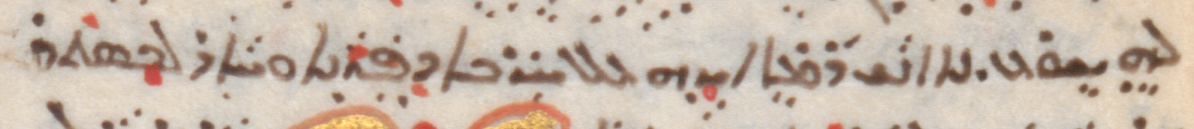ܠܗ ܝܫܘܥ. ܠܐ ܐܢܫ ܪܡ̇ܐ ܐܝܕܗ ܥܠ ܚܪܒܐ ܕܦܕܢܐ ܘܚ̇ܐܪ ܠܒܣܬܪ
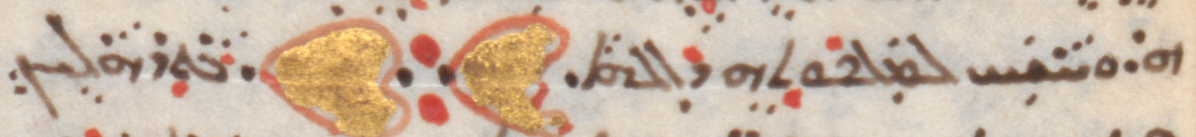ܗ܇ ܘܚ̇ܫܚ ܠܡܠܟܘܬܗ ܕܐܠܗܐ.܀. ܒܬܪ ܗܠܝܢ܆
